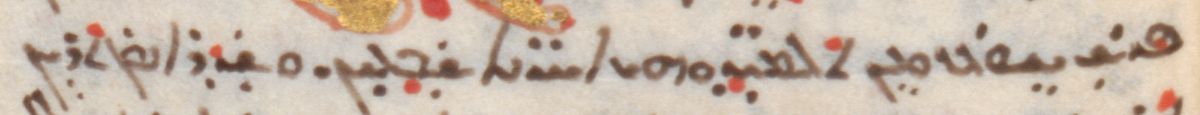ܦܪܫ̣ ܝܫܘܥ ܡ̣ܢ ܬܠܡܝ̈ܕܘܗܝ ܐܚܪ̈ܢܐ ܫܒܥܝܢ. ܘܫ̣ܕܪ ܐܢܘܢ ܬܪܝܢ
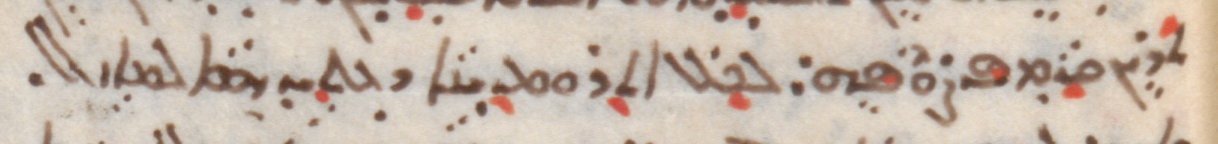ܬܪܝܢ ܩܕܡ ܦܪܨܘܦܗ܇ ܠܟܠ ܐܬܪ ܘܡܕܝܢܐ ܕܥܬܝܕ ܗܘܐ ܠܡܐܙܠ.
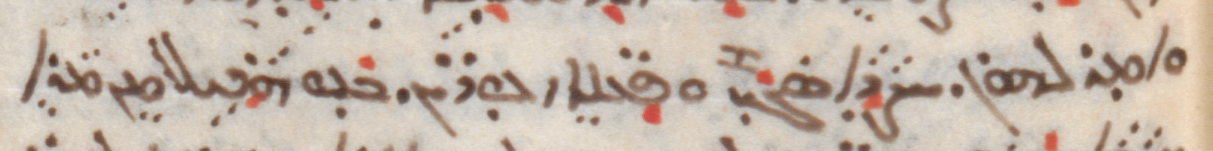ܘܐܡ̣ܪ ܠܗܘܢ. ܚܨܕܐ ܣܓܝ ܘܦܥ̈ܠܐ ܙܥܘܪ̈ܝܢ. ܒܥܘ ܗܟܝܠ ܡ̣ܢ ܡܪܐ
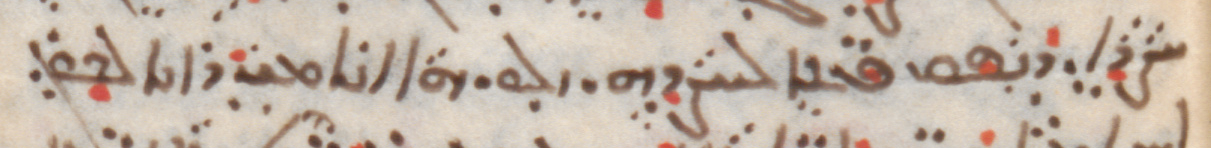ܚܨܕܐ܆ ܕܢܦܩ ܦܥ̈ܠܐ ܠܚܨܕܗ. ܙܠܘ. ܗܐ ܐܢܐ ܡܫ̇ܕܪ ܐܢܐ ܠܟܘܢ܆
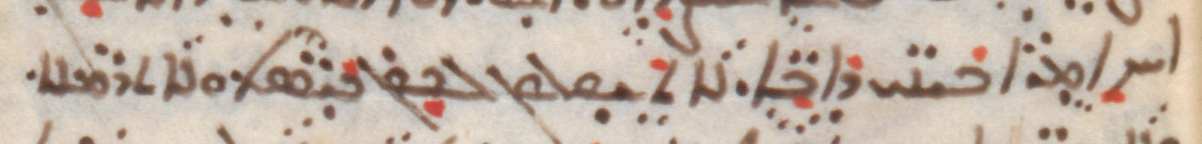ܐܝܟ ܐܡܪ̈ܐ ܒܝܢܝ ܕܐܒ̈ܐ. ܠܐ ܬܫܩܠܘܢ ܠܟܘܢ ܟܝ̈ܣܐ. ܘܠܐ ܬܪ̈ܡܠܐ.
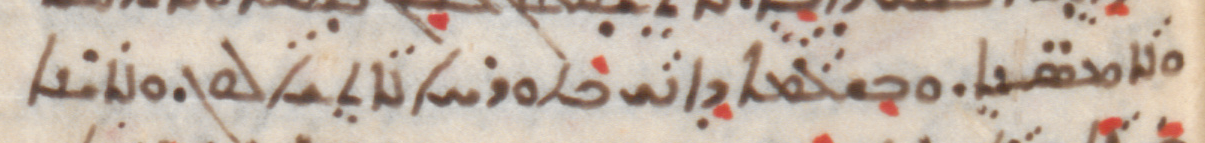ܘܠܐ ܡܣ̈ܢܐ. ܘܒܫܠܡܐ ܕܐܢܫ ܒܐܘܪܚܐ ܠܐ ܬܫܐܠܘܢ. ܘܠܐܝܢܐ
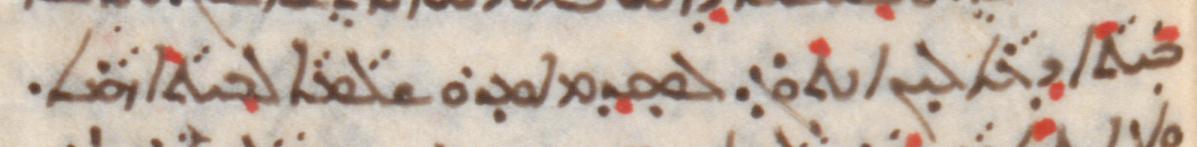ܒܝܬܐ ܕܥ̇ܐܠܝܢ ܐܢܬܘܢ܆ ܠܘܩܕܡ ܐܡܪܘ ܫܠܡܐ ܠܒܝܬܐ ܗܢܐ.
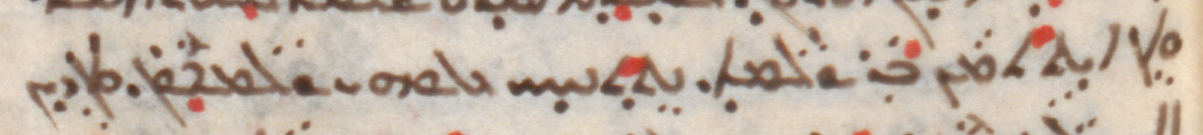ܘܐܢ ܐܝܬ ܬܡܢ ܒܪ ܫܠܡܐ. ܢܬܬܢܝܚ ܟܠܘܗܝ ܫܠܡܟܘܢ. ܘܐܢ ܕܝܢ
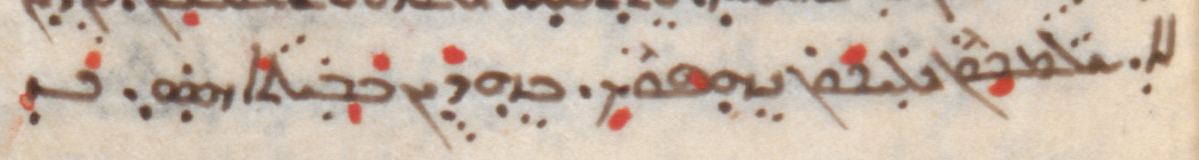ܠܐ܆ ܫܠܡܟܘܢ ܥܠܝܟܘܢ ܢܗܦܘܟ. ܒܗ ܕܝܢ ܒܒܝܬܐ ܗܘܘ܆ ܟܕ
